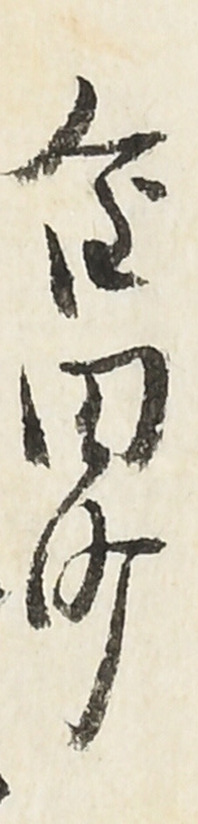金田町
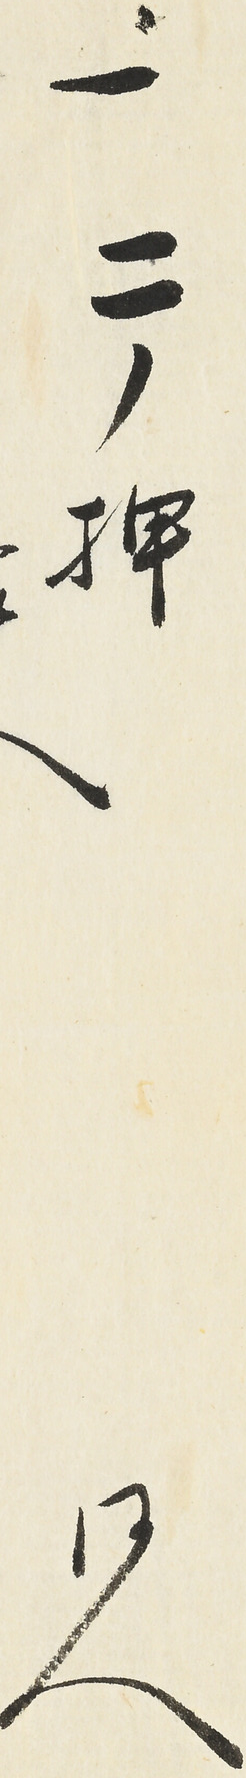一二ノ押同人
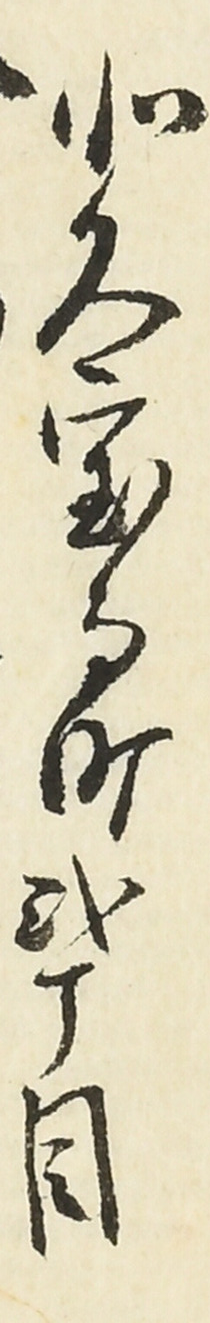北久宝寺町弐丁目
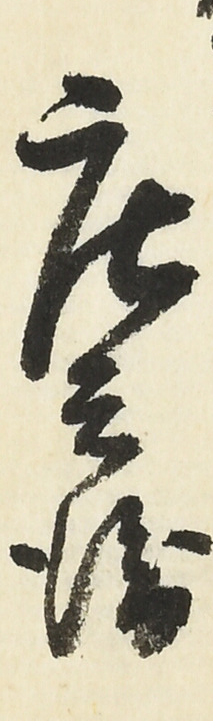佐兵衛
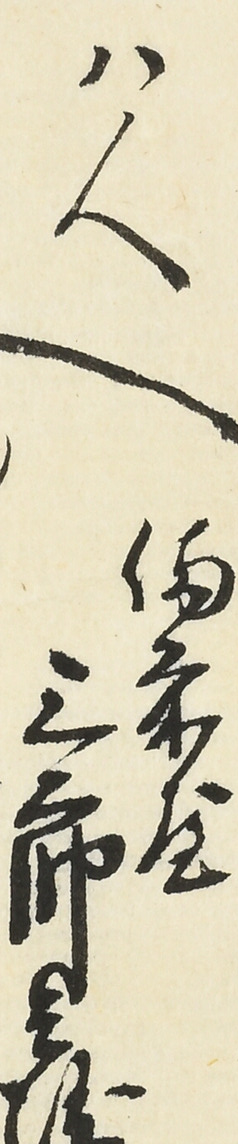八人備前屋
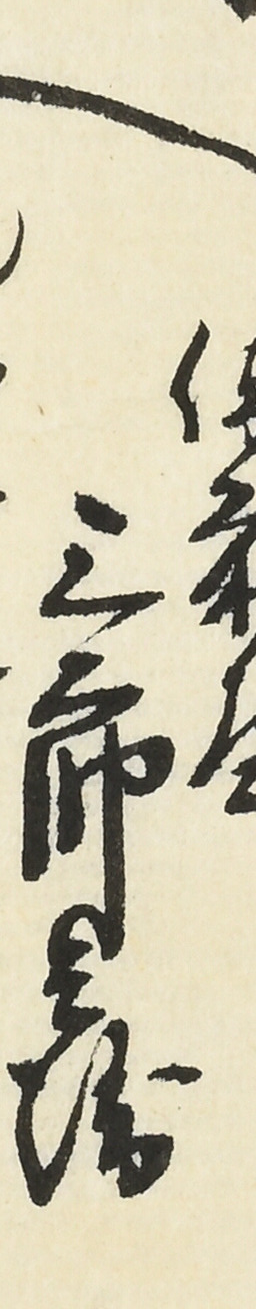三郎兵衛
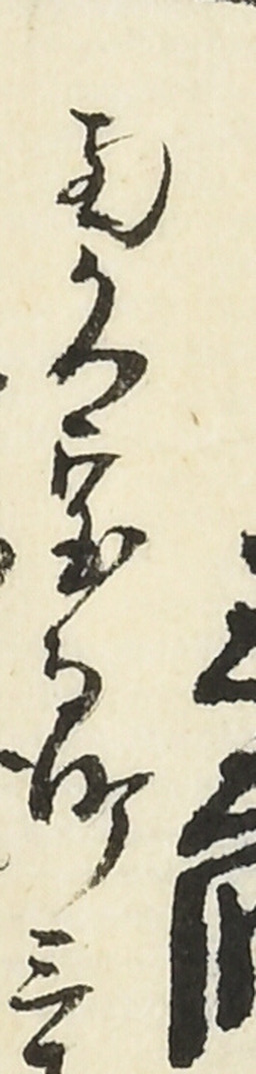南久宝寺町三丁目
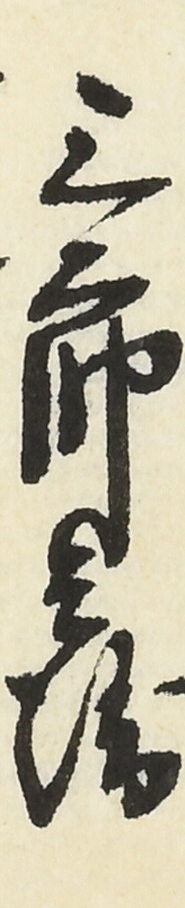三郎兵衛
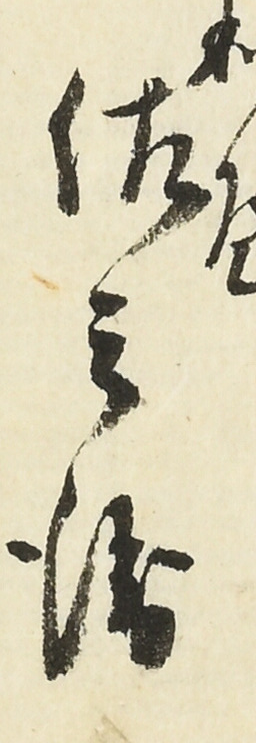佐兵衛
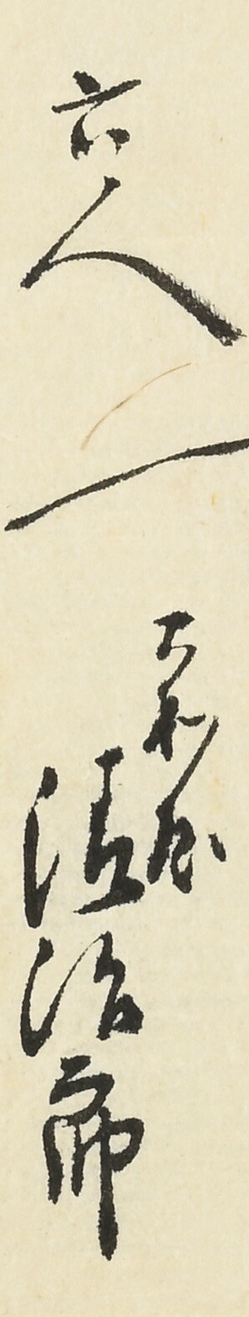清治郎
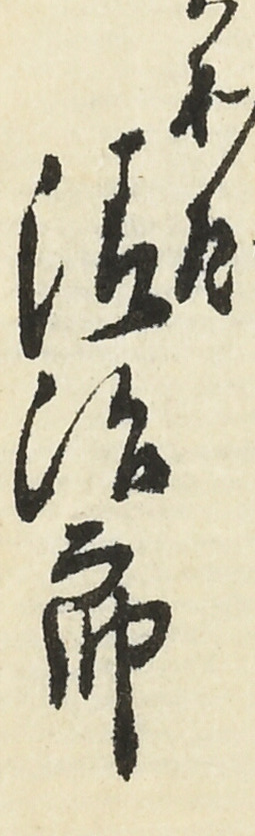清治郎

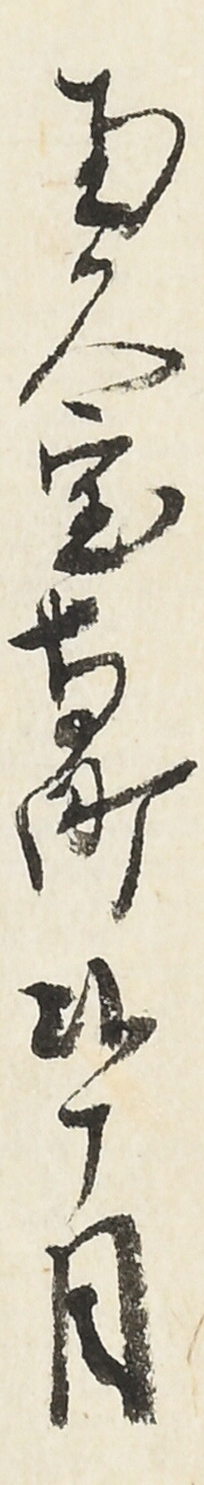南久宝寺町弐丁目
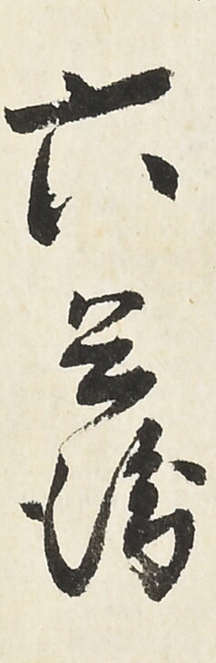利兵衛
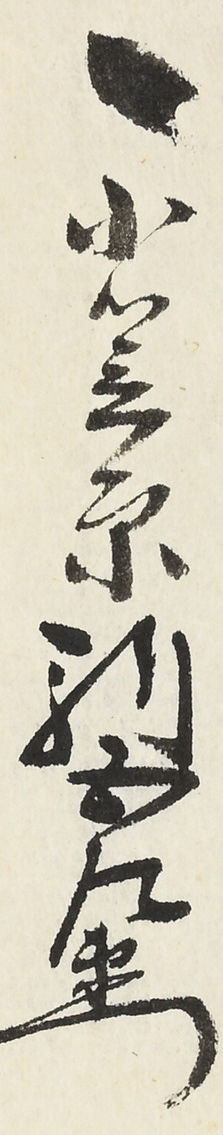小笠原新五左衛門
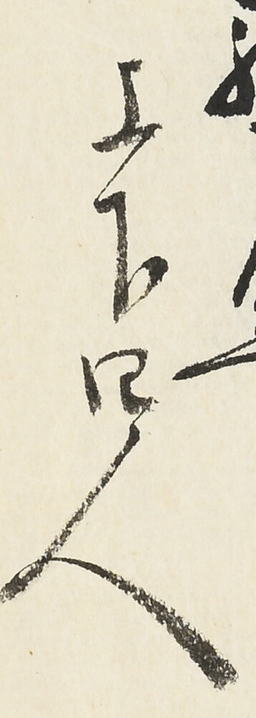上下四人
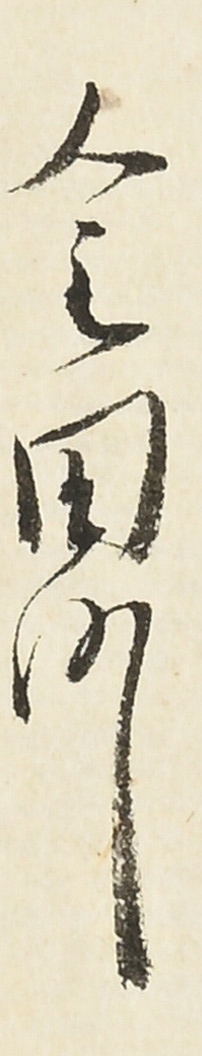金田町
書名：内藤大和守下宿割
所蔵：伊那市立高遠町図書館・合同会社AMANE
